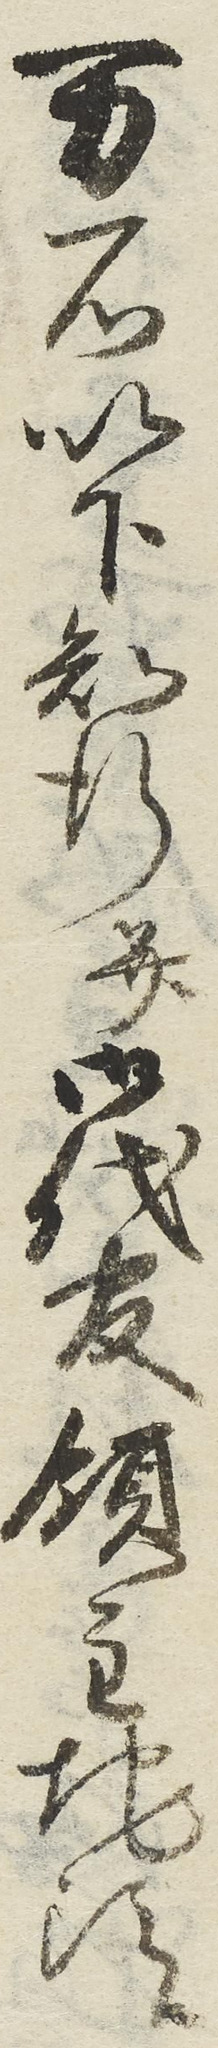万石以下知行并御代官領主地頭
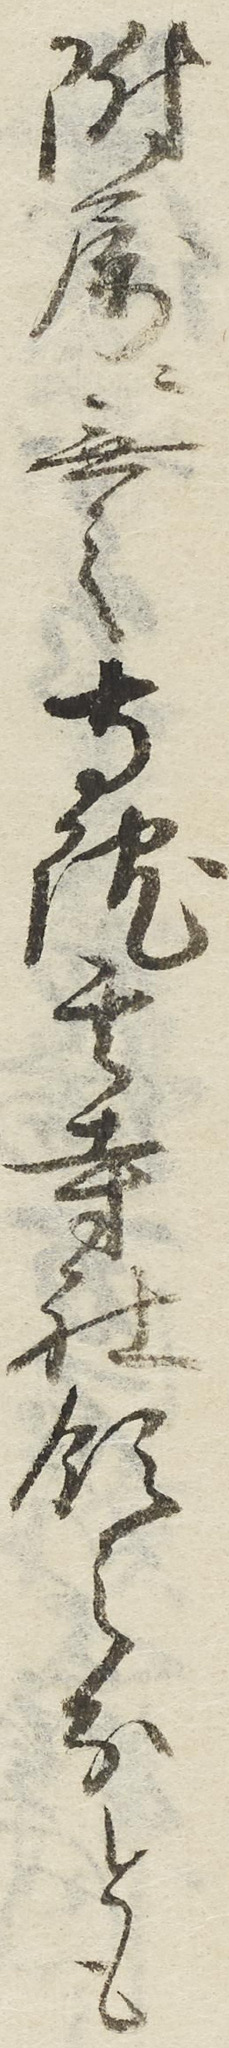附属二無之寺院其寺社領之分とも
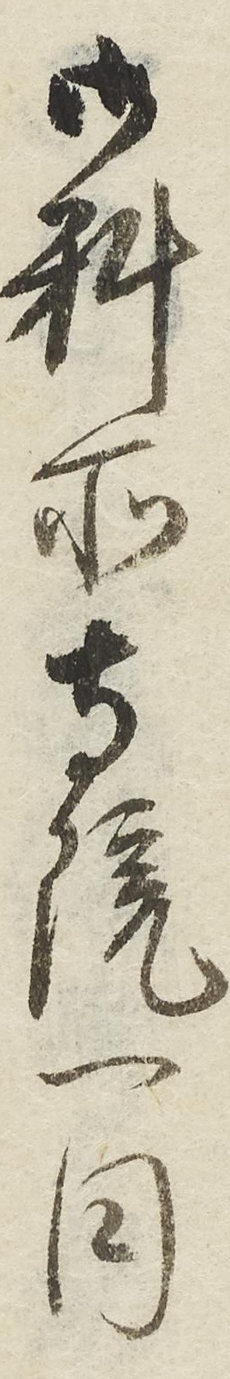御料所寺院一同
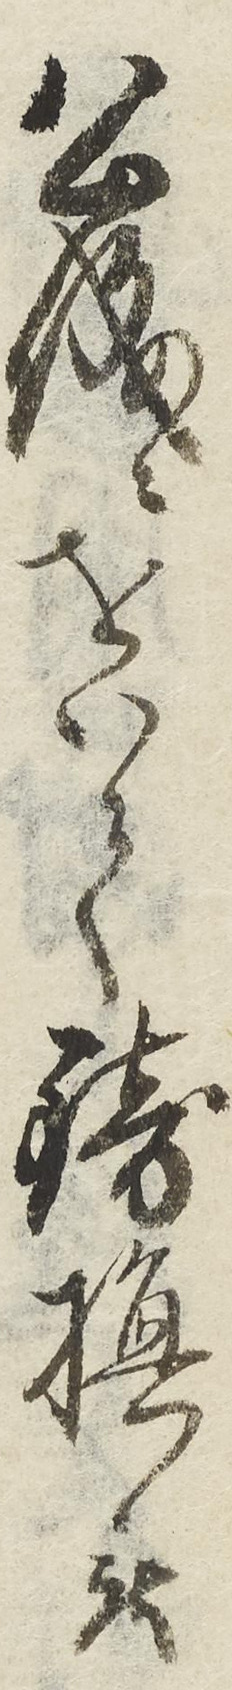公儀二をいて鋳換被
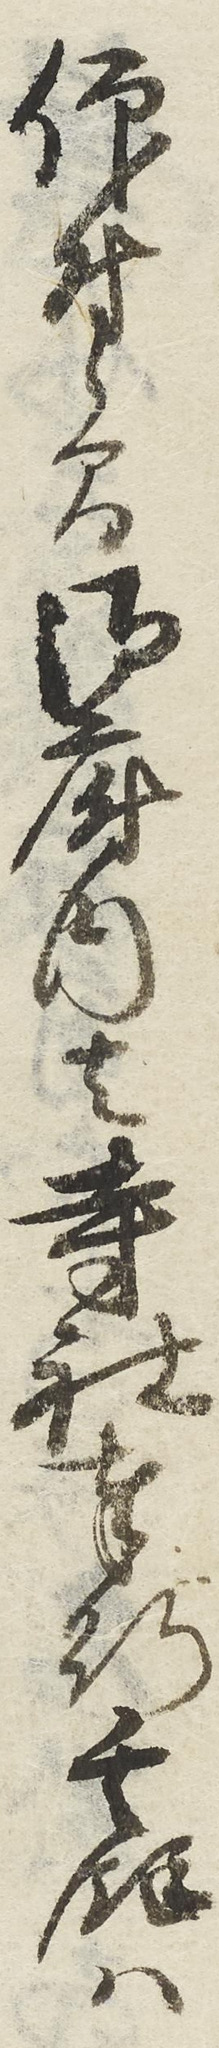仰付候間御府内は寺社奉行其余ハ
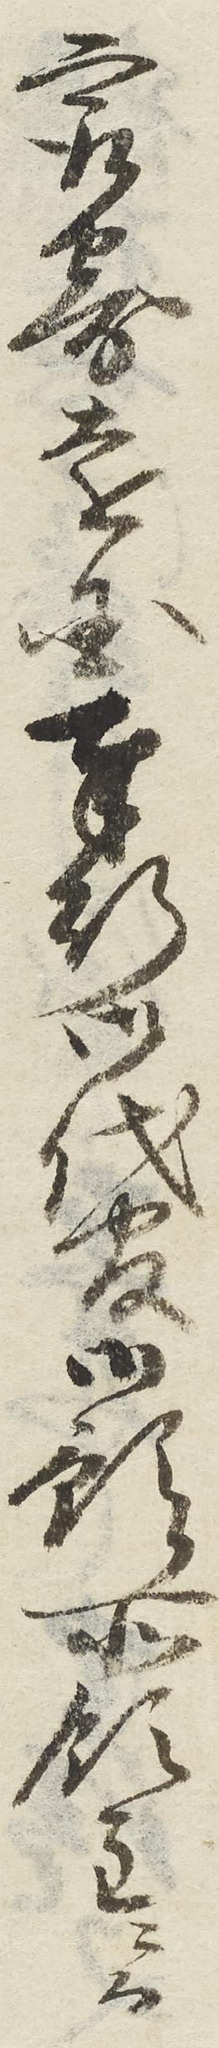最寄遠国奉行御代官御領所主二而
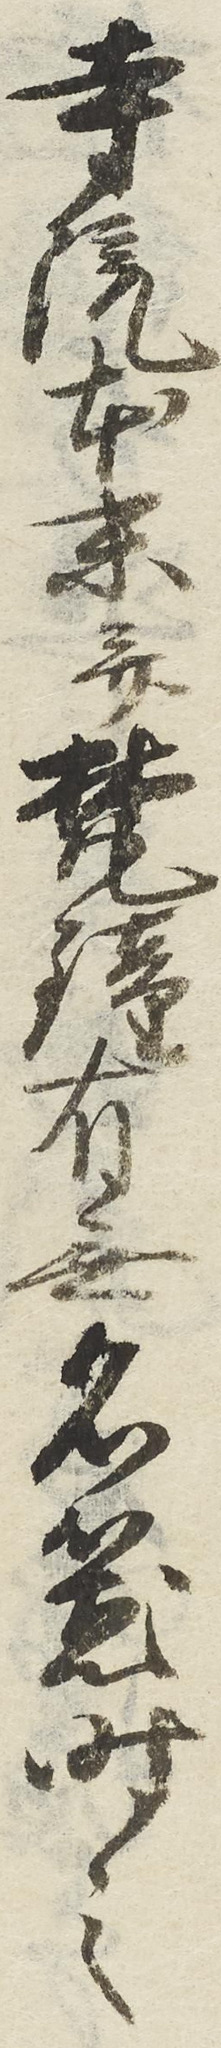寺院本末并梵鐘有無名器時之
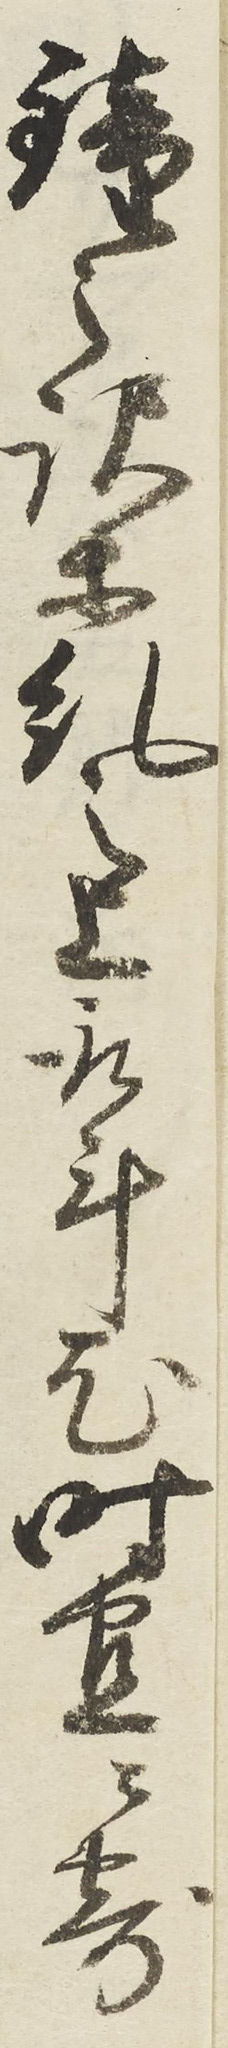鐘之訳等糺之上取斗尤時宜二寄
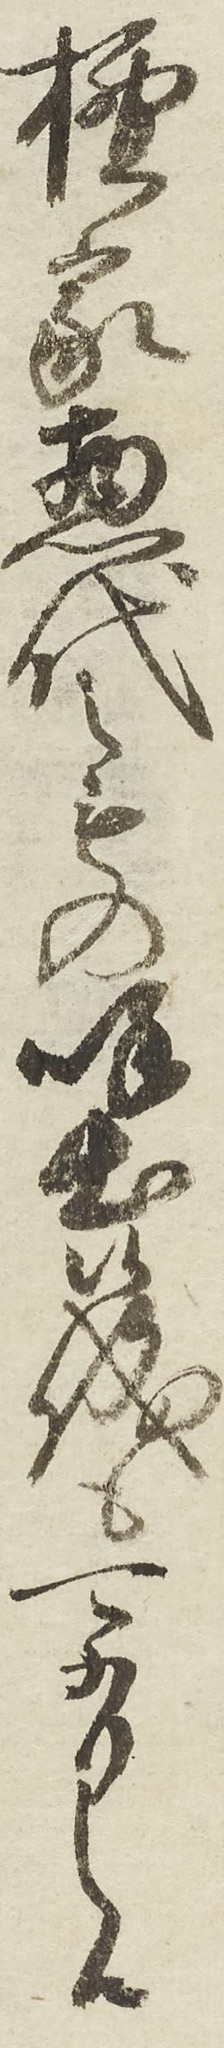檀家惣代之もの呼出候儀も可有之候
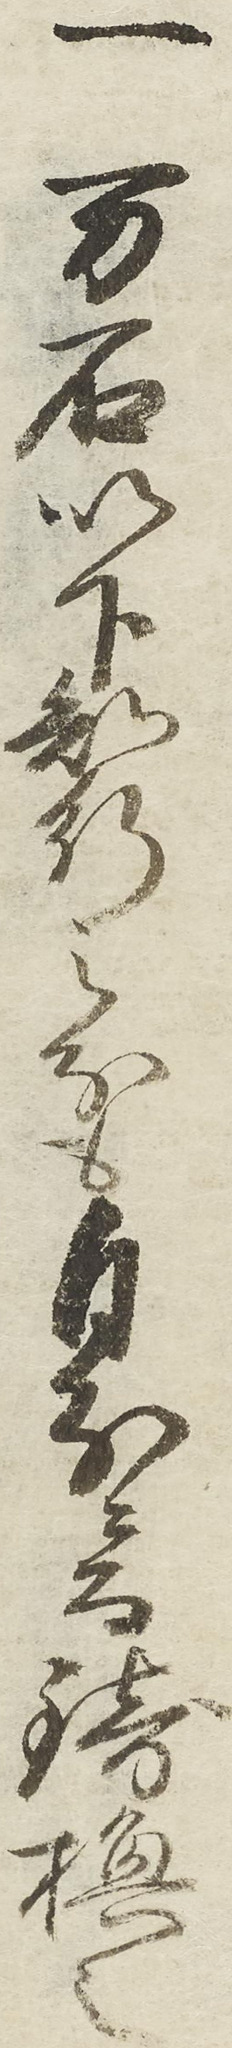一万石以下知行之分も自分二而鋳換之
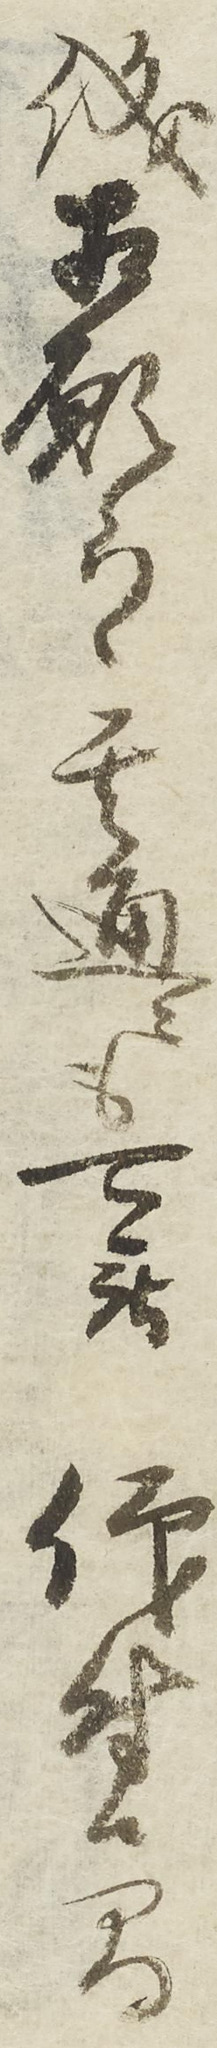儀相願候ハゝ其通二も可被仰付候間
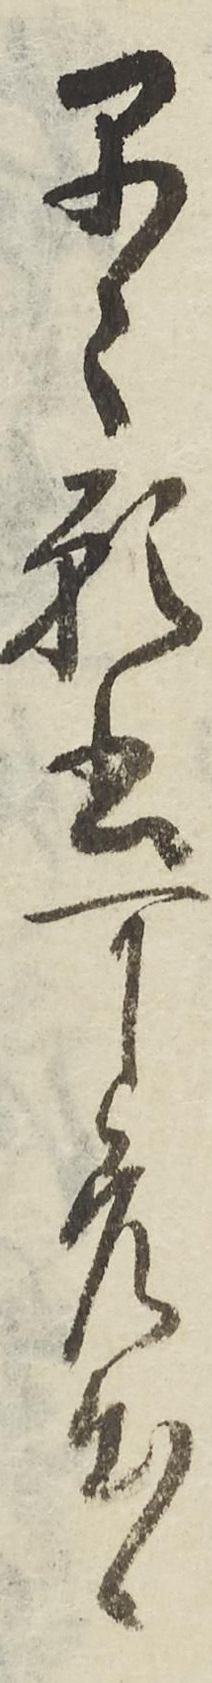早々願書可差出候
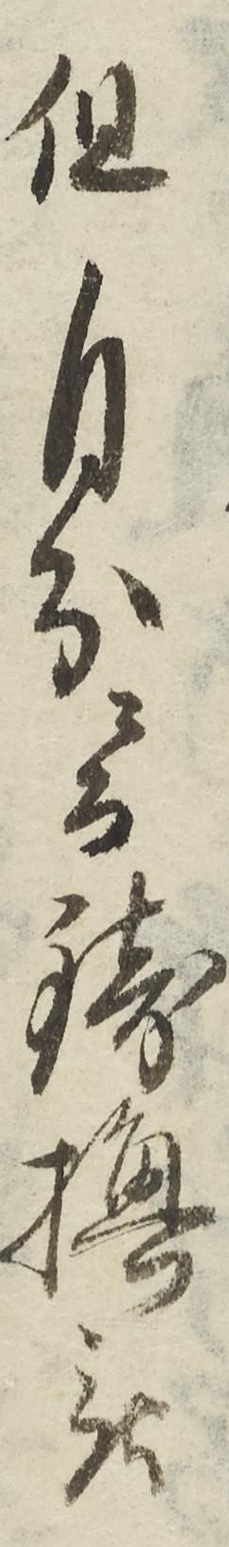但自分二而鋳換被
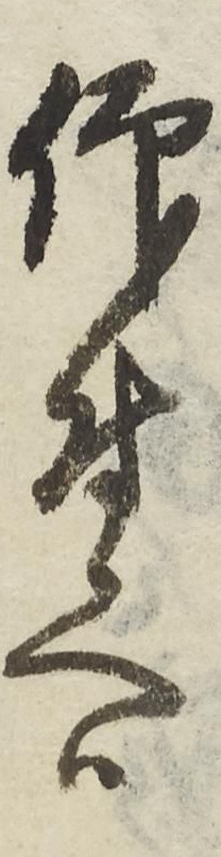仰付候へハ
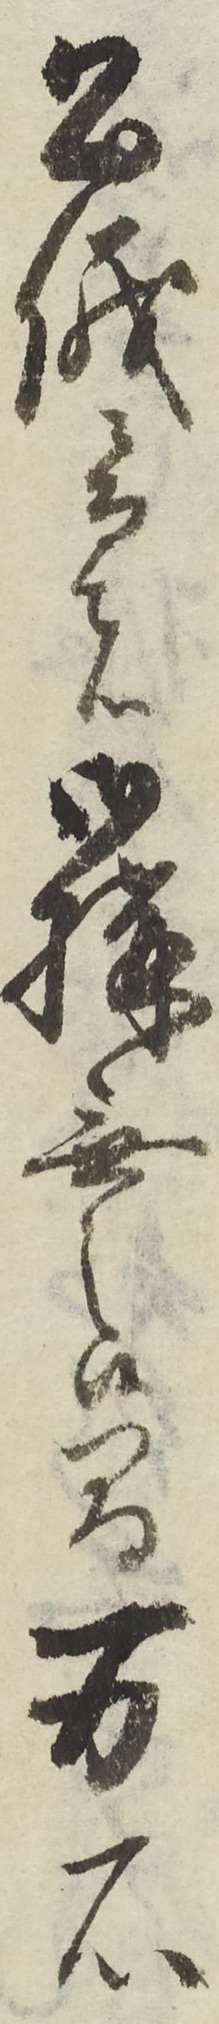公儀二而は御構無之候間万石

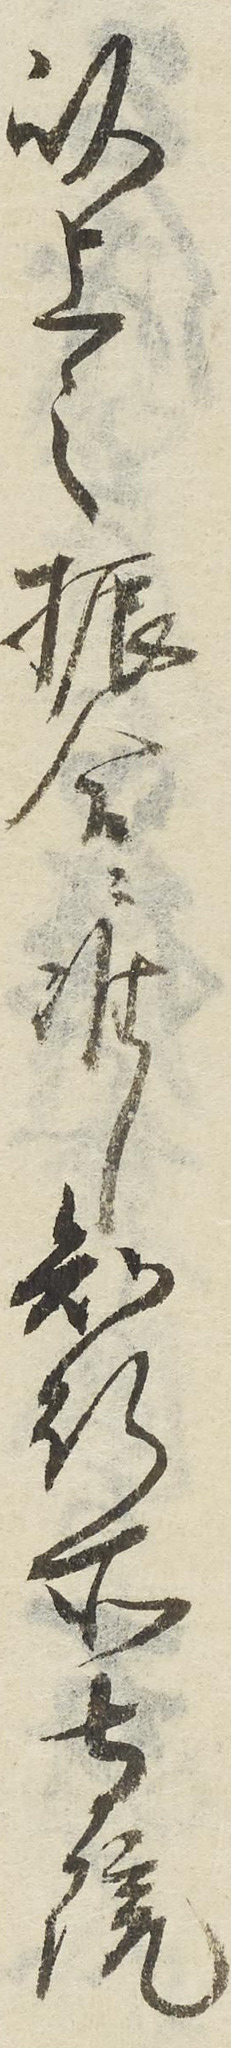以上之振合二準し知行所寺院
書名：[梵鐘差出一件]
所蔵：東京大学地震研究所図書室 Earthquake Research Institute Library, The University of Tokyo, JAPAN
